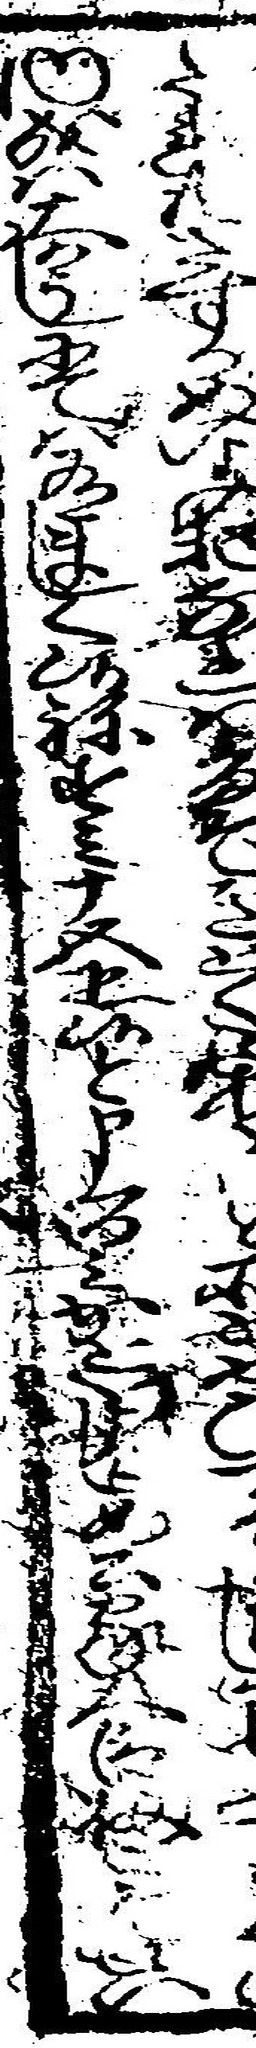内成は大かうしにては有ましく候ねすみ十五匹候と申上るみかとしめ公家大臣扨こそせい
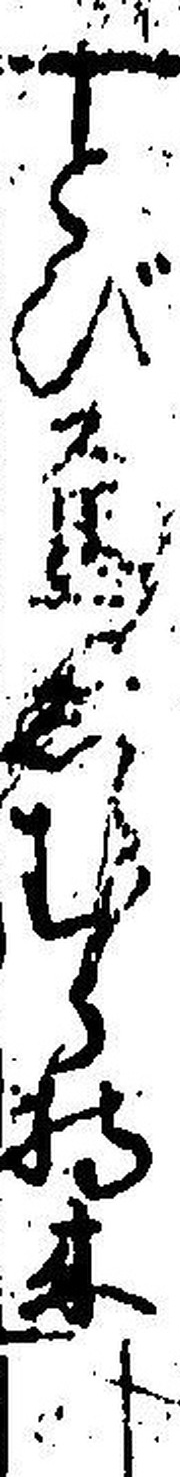とび烏しゝむら持来
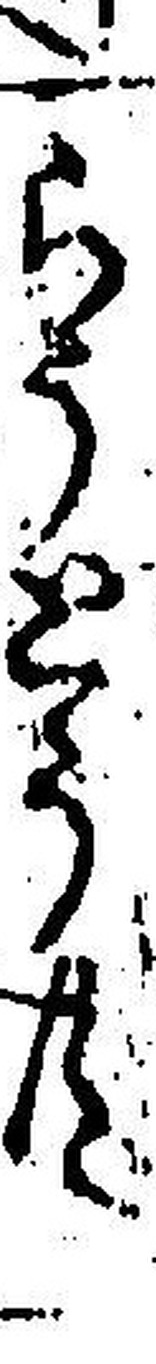らうとう共
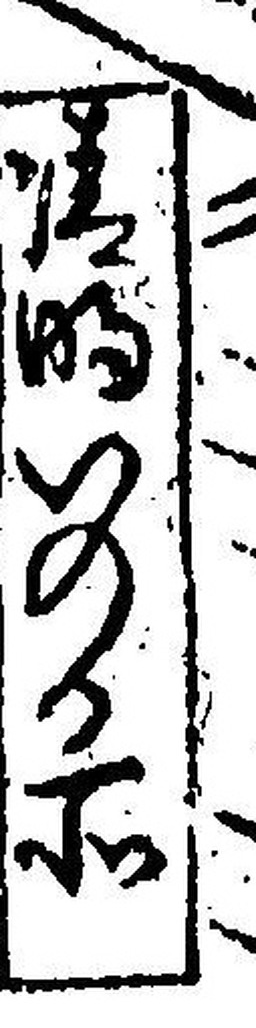清明いのる所
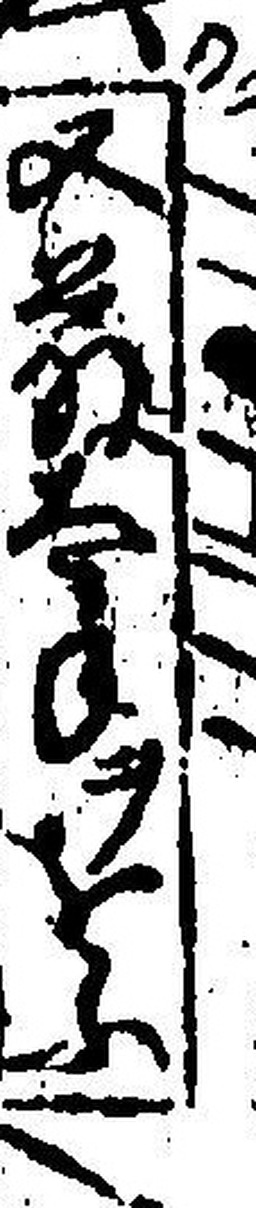御藤太手

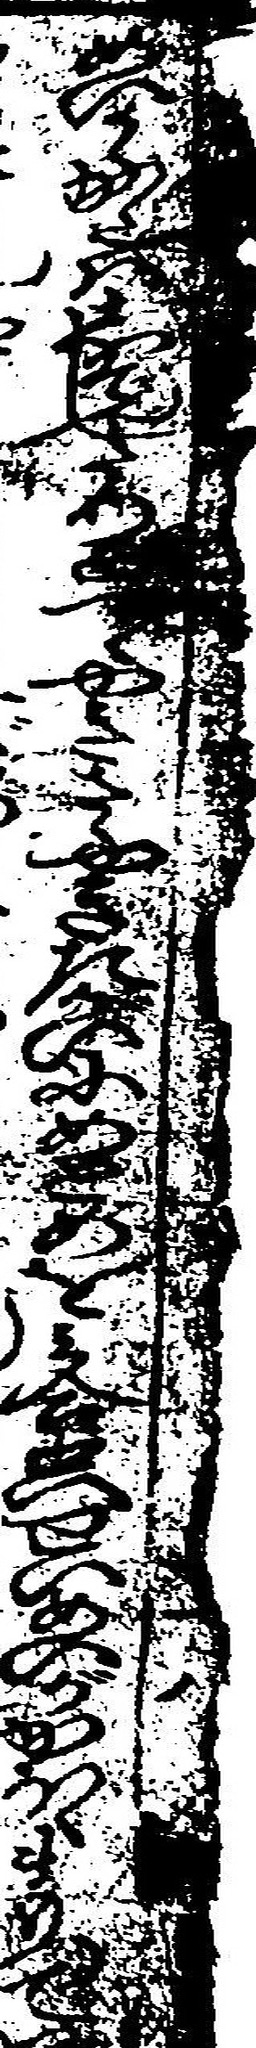めいうらかたはしそんじたりとつゝやきさゝやきたかいにめとめをみ合只せいめいがかほゝまもつていたり
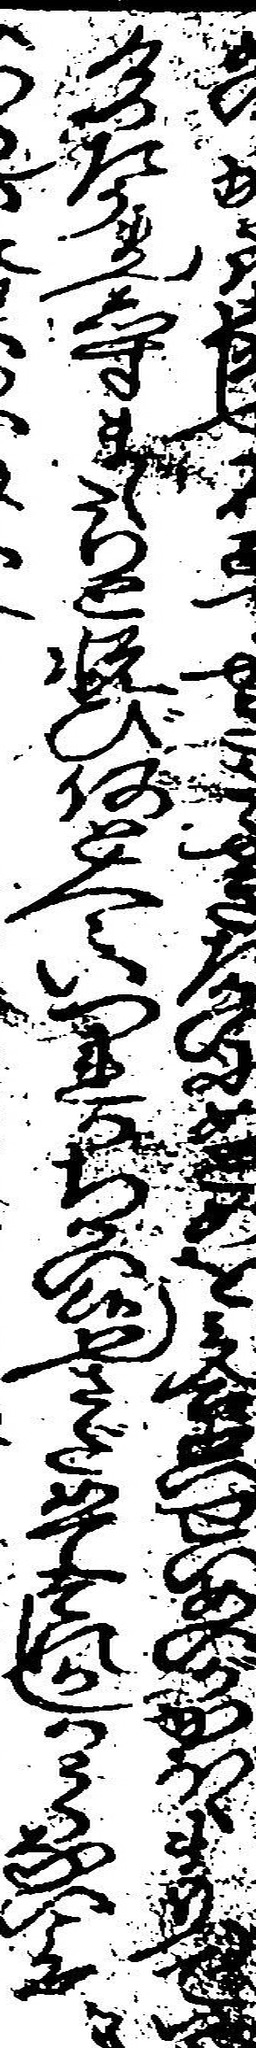けるたうまんしすましたりと悦び何と人々いつれかちかい候はんさだめてそれかしかうらない
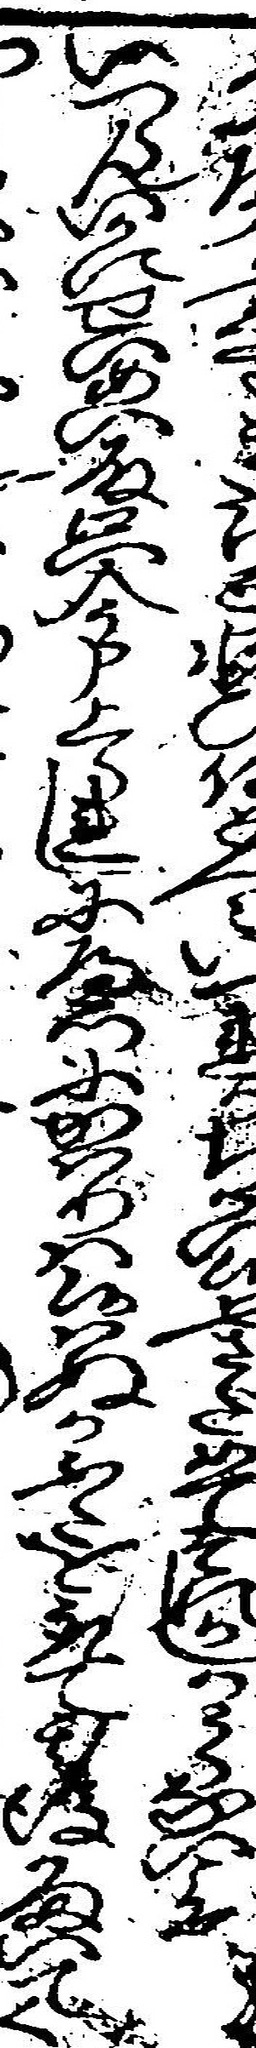いつらんいかにせいめい殿只今申上られしにへつにかはりは候はぬかふたを取て其後かまいてく
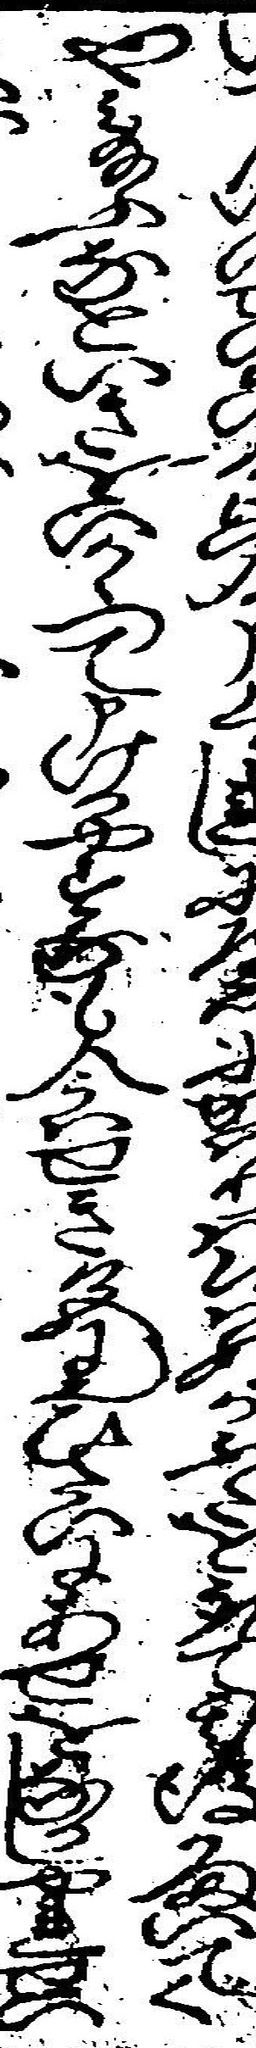やみ給ふなといきをいかゝつて申けるやすなも今はせき色に也ひたいにあせをなかしやれせい
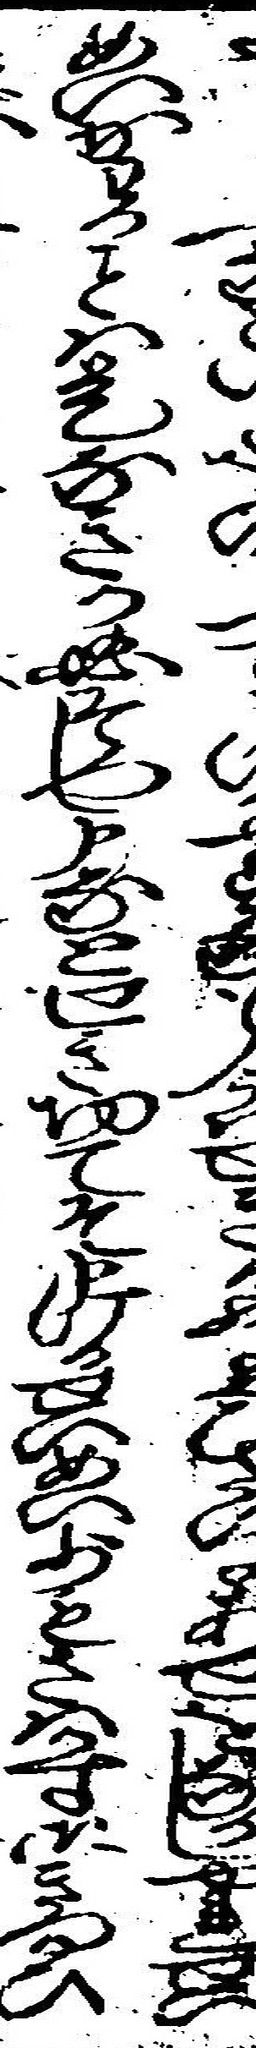めいかわることは是なきか必そつし申なとせき切りてそ申けるせいめい少もさはかす御きつかひ
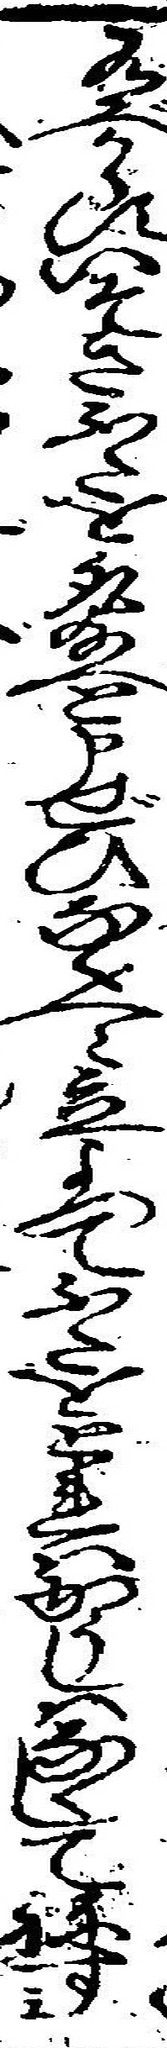有べからすいそきふたを取給へと申ぜひなく人々立よつてふたをとれはかうしはなくしてねすみ
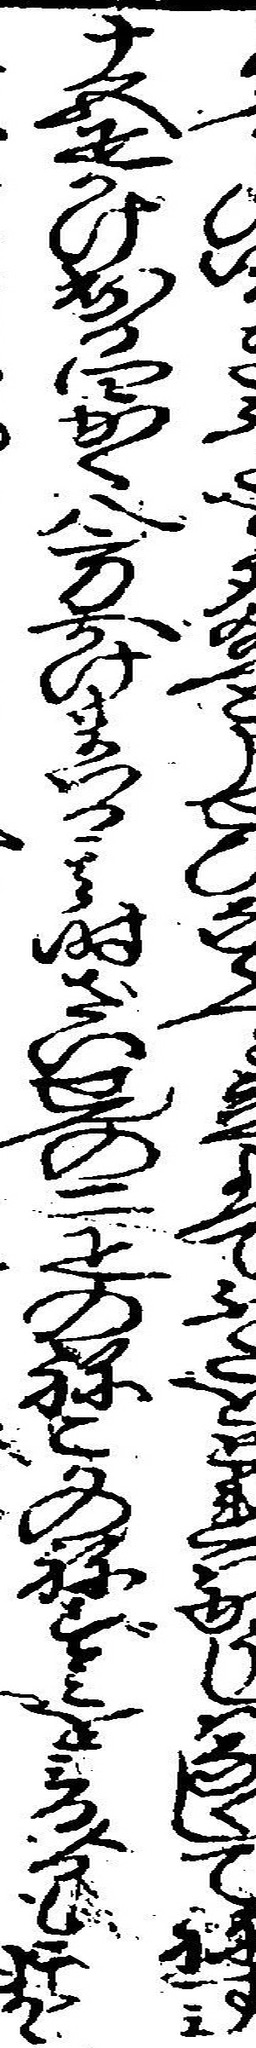十五匹かけ出る四かく八方へかけまはる其時さいせんの二匹のねこかのねずみをみるよりも其まゝ
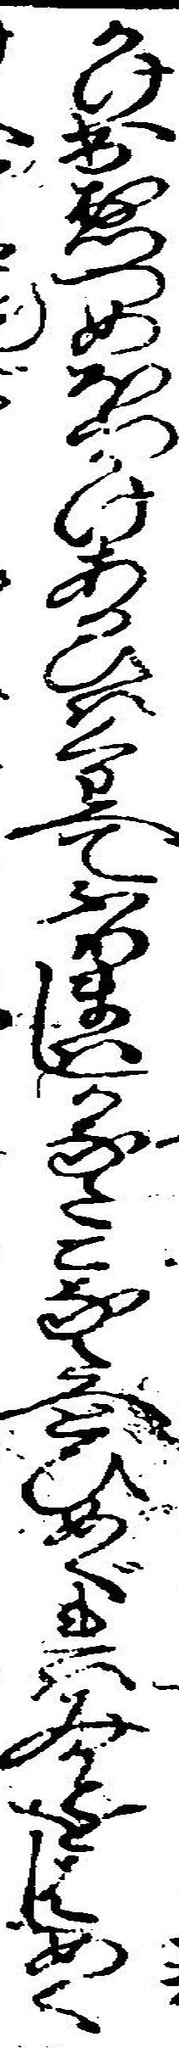かけ出おつつめほつかけあるひはくわへてふりまはしかなたこなたへとひめぐれはみかとをはしめく
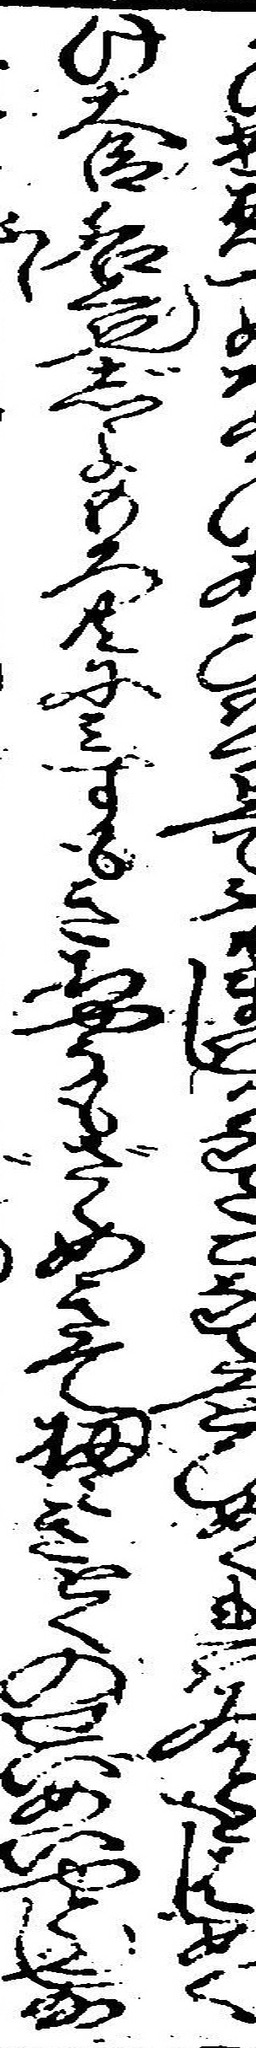け大臣后くわんじよもろ共にみすもきちやうもざゝめきて扨々きとくのせいめいやとかんし給
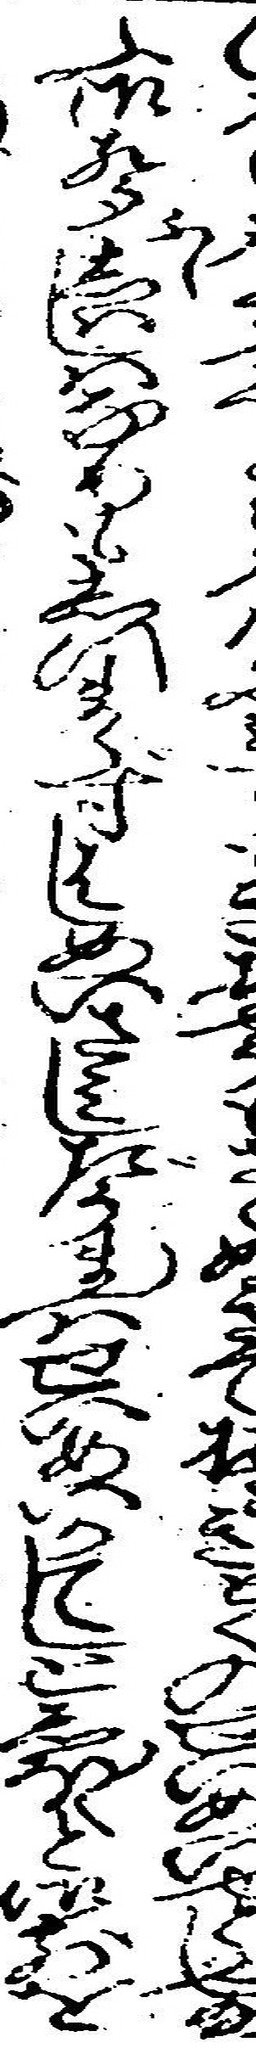ふ御声ふししはしはなりもしつまらずはしめいさみしだうまんはせいめいかてしとしほ〳〵と御前を
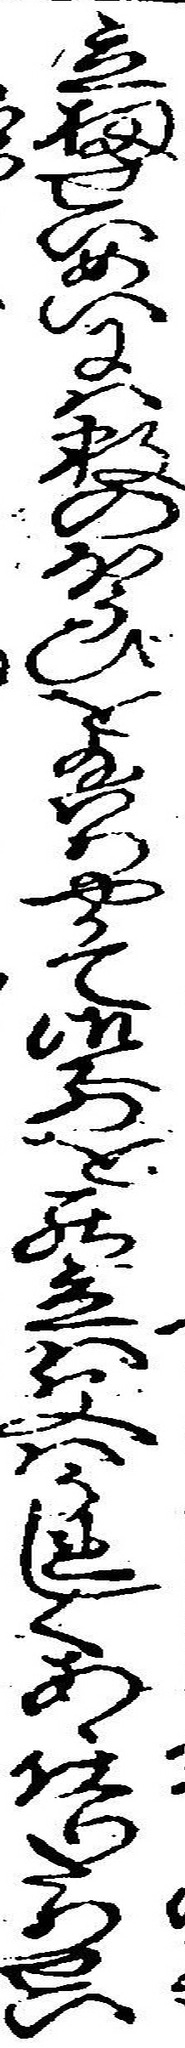立扨せいめいには数のほびを給はりやかて御前を罷立は父はうれしくあゝ仕りたりせい
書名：[しのだづまつりぎつね付あべの清明出生]
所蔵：東京大学総合図書館 General Library in the University of Tokyo, JAPAN
